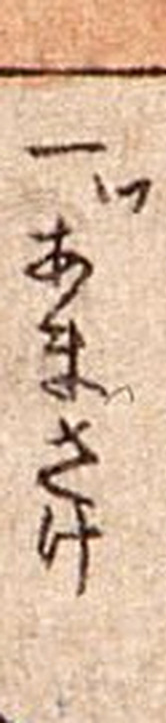一つあまさけ
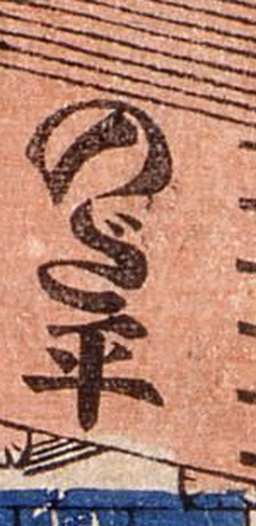のだ平
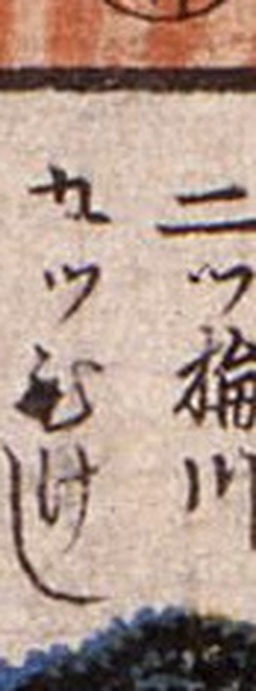二つひけし
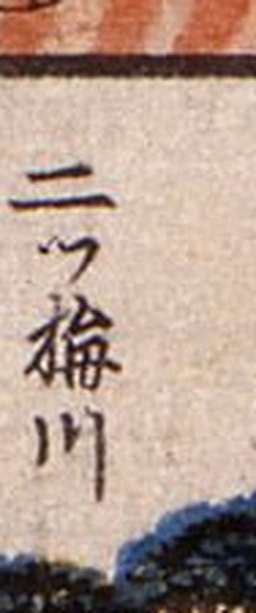二つ梅川
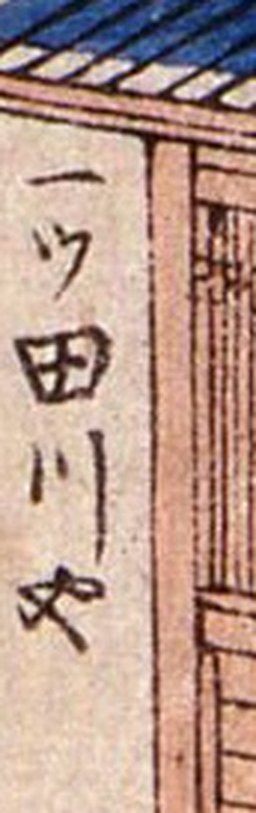一つ田川や
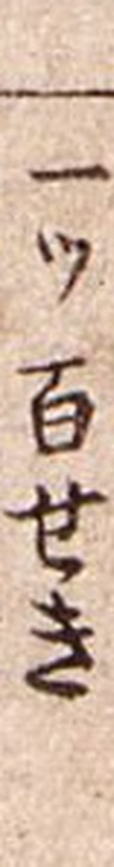一つ百せき
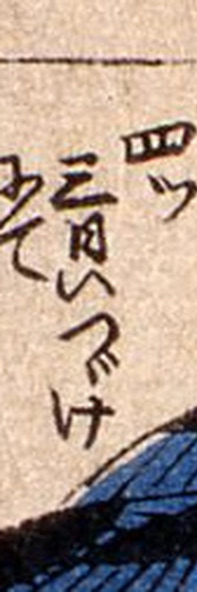三日いつゞけ
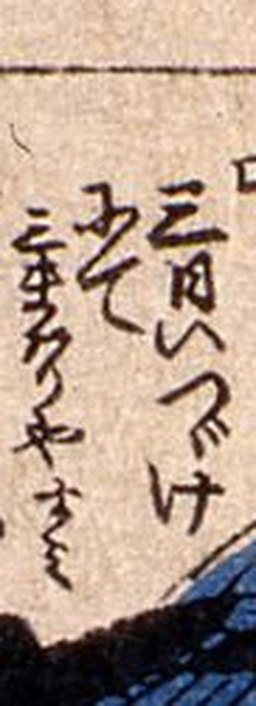三まはりやすみ
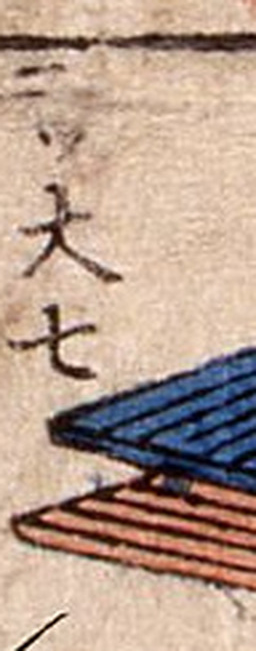一つ大七
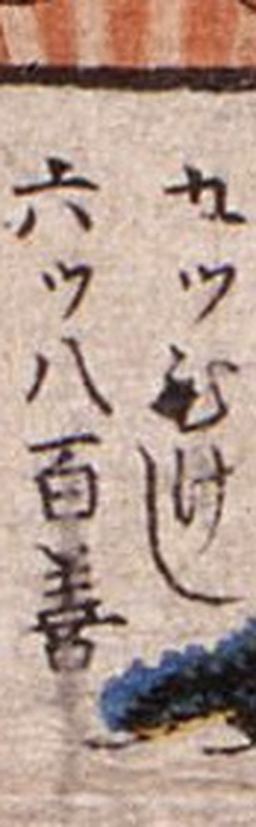六つ八百善
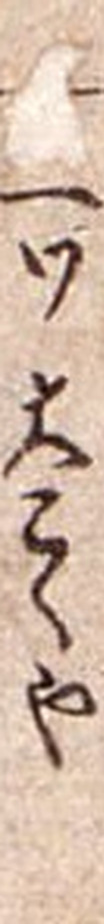六つ大こくや
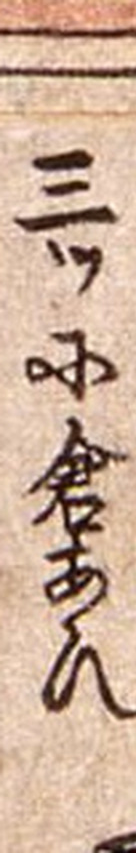三つ小倉あん
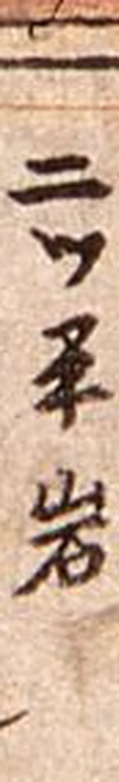二つ平岩
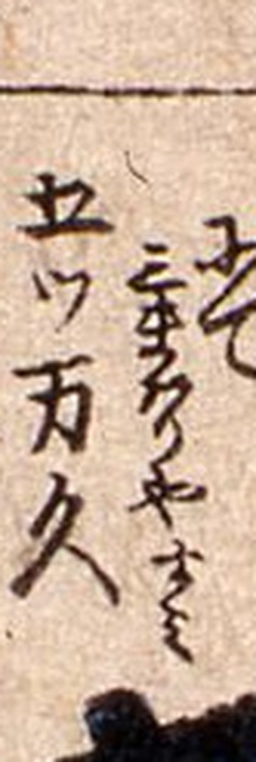五つ万久
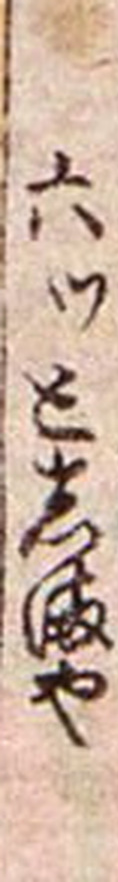六つとしまや
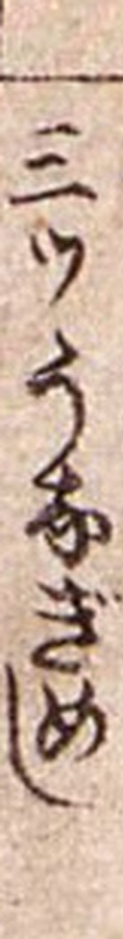三つうなぎめし
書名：新版御府内流行名物案内雙六
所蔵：東京学芸大学附属図書館
